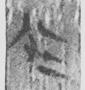八十=
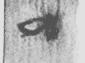四
